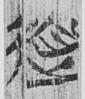道
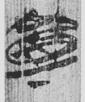○（洒）
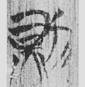則
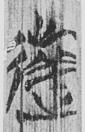○（失）
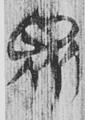衆
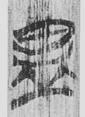○（猛）
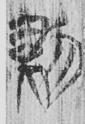則
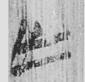亡（無）
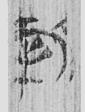新（親）
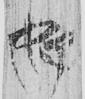好
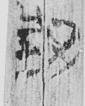型（刑）
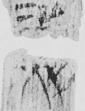則
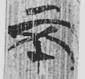不
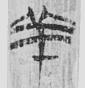羊（祥）
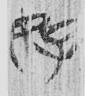好
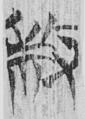殺
